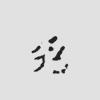從
